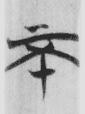不
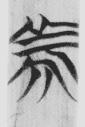羕
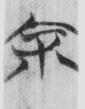余
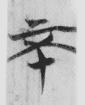不
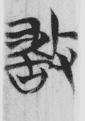敢
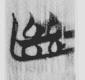㡭
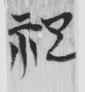祀
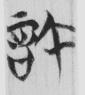許
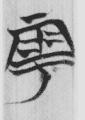𩁹
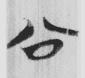公
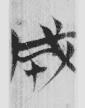成
